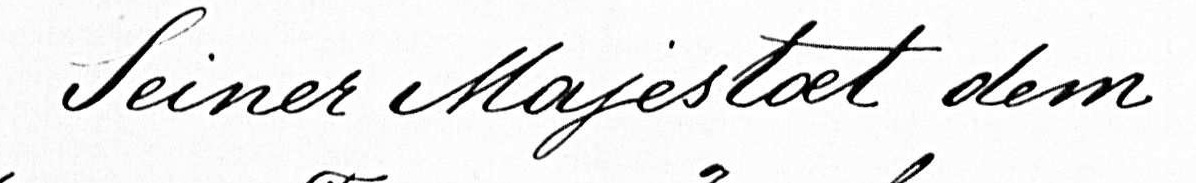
Seiner Majestæt dem
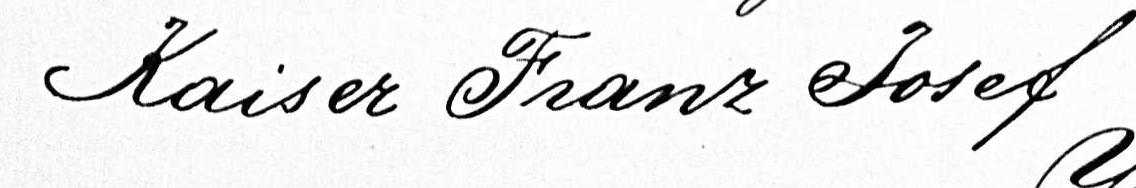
Kaiser Franz Josef
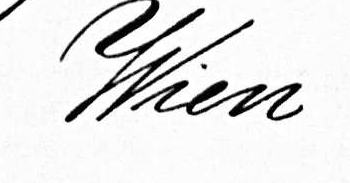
Wien
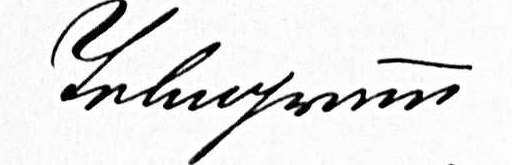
Telegramm
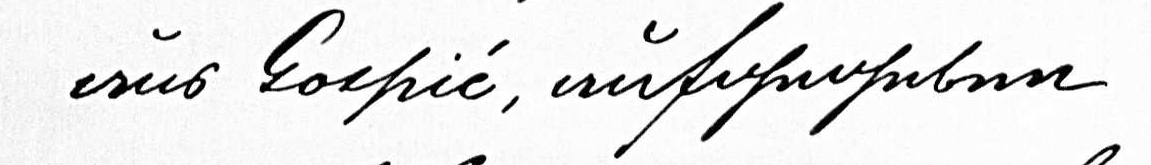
aus Gospić, aufgegeben
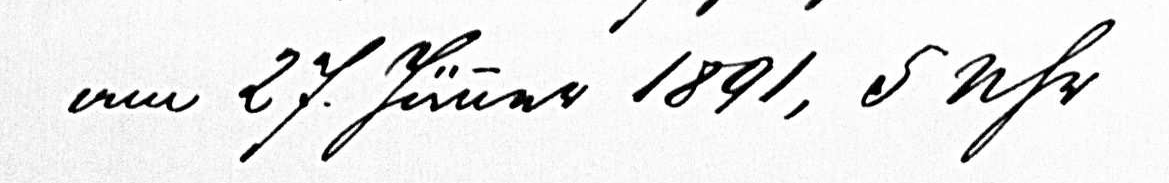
am 27. Jänner 1891, 5 Uhr
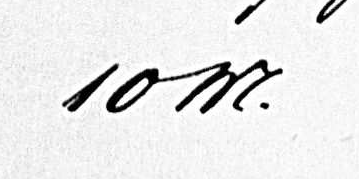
10 M.
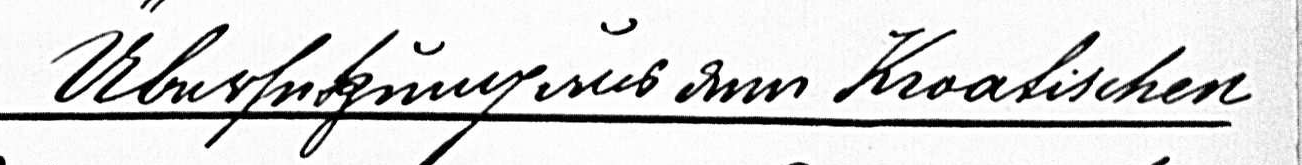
Übersetzung aus dem Kroatischen
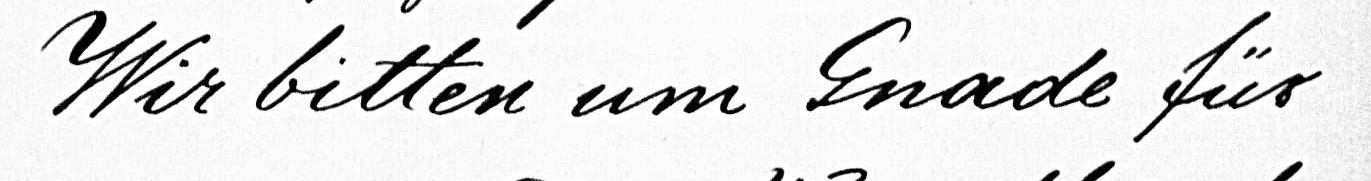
Wir bitten um Gnade für
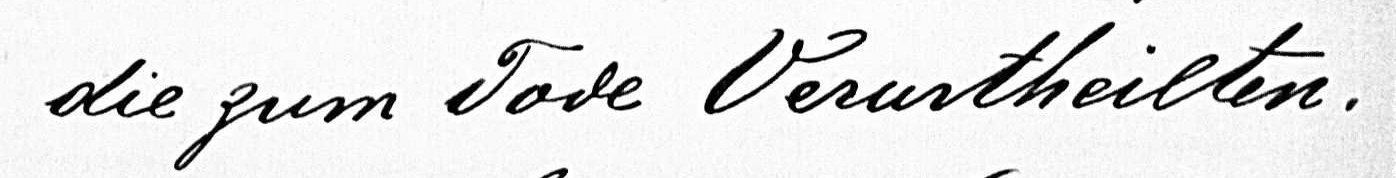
die zum Tode Verurtheilten.
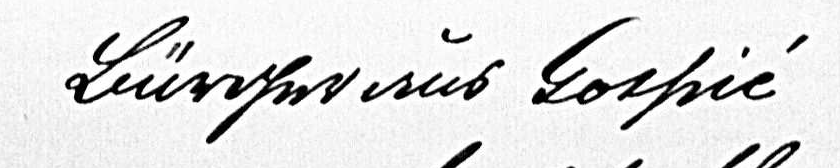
Bürger aus Gospić
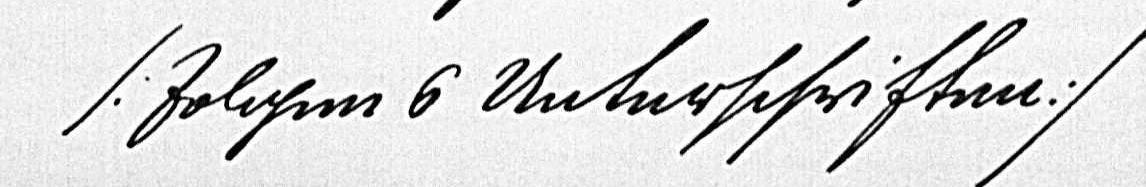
/: Folgen 6 Unterschriften :/
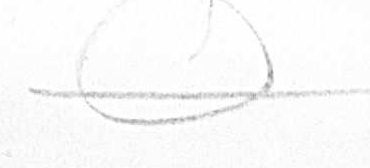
xx
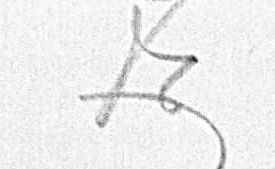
xx
